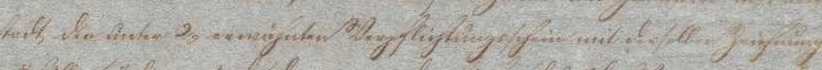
stadt den unter 2, erwähnten Verpflichtungsschein mit derselben Zeichnung
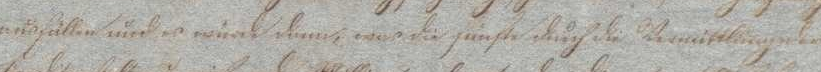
ausfüllen und es würde dann, was die fünfte durch die Vermittlung der
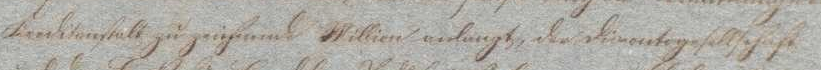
Kreditanstalt zu zeichnende Million anlangt, der Discontogesellschaft
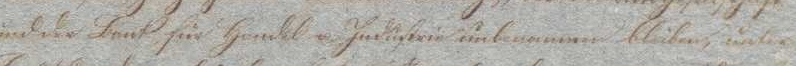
und der Bank für Handel & Industire unbenommen bleiben, unter
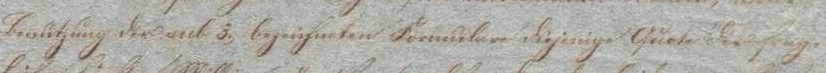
Benutzung der sub 3., bezeichneten Formulare diejenige Quote der frag-
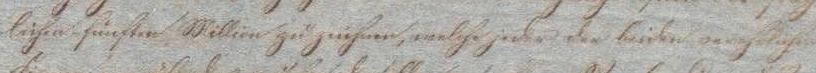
lichen fünften Million zu zeichnen, welche jeder der beiden verehrlichen
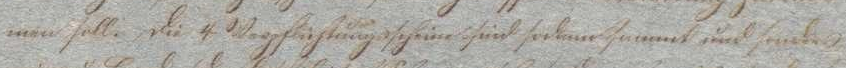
men soll. Die 4 Verpflichtungsscheine sind sodann sammt und sonders
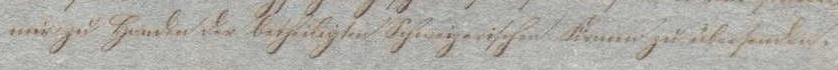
mir zu Handen der betheiligten Schweizerischen Firmen zu übersenden.
